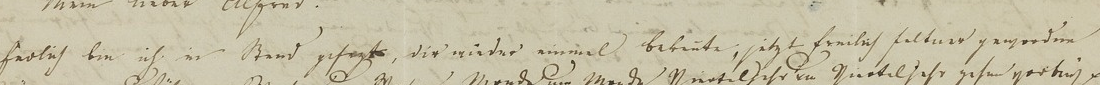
Endlich bin ich in Stand gesezt, dir wieder einmal bekannte, jetzt freilich seltner gewordne
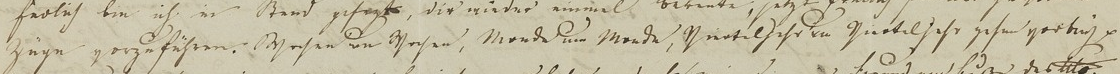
Züge vorzuführen. Wochen um Wochen, Monde um Monde, Vierteljahr um Vierteljahr gehen vorbey &
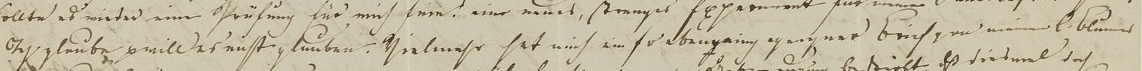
Ich glaube & will es nicht glauben. Vielmehr hat mich ein so eben eingegangner Brief von meinem l. Blumer
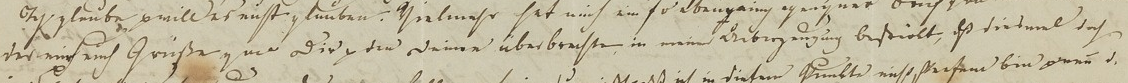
der mir auch Grüße von dir & den Deinen überbrachte, in meiner Ueberzeugung bestärkt, dß diesmal doch
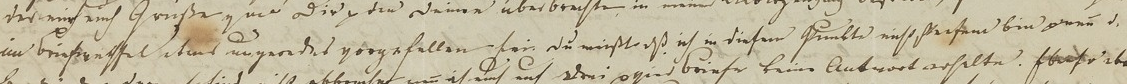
im Briefwechsel etwas ungerades vorgefallen sei. Du weißt dß ich in diesem Punkte nicht sparsam bin & wenn d.
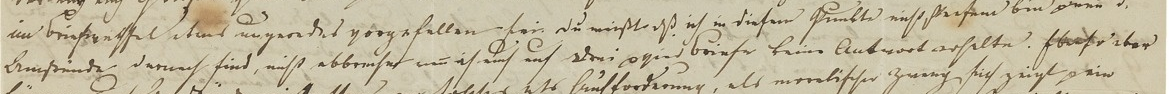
Umstände darnach sind, nicht abbreche wenn ich auch auf drei & vier Briefe keine Antwort erhalte. Ebenso aber
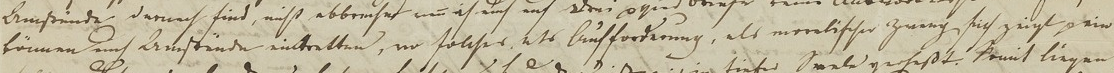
können auch Umstände eintretten, wo solches als Aufforderung, als moralischer Zwang sich zeigt & ein
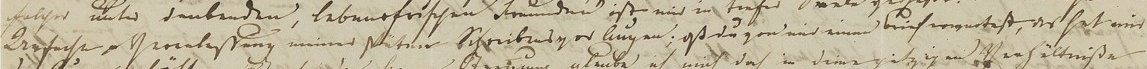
Ursache & Veranlassung meines späten Schreibens vor Augen; dß du von mir einen Brief erwartest, das hat mir
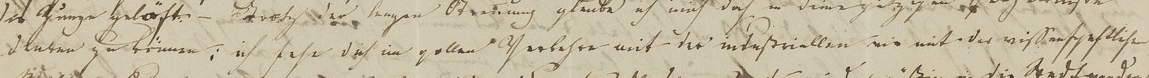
denken zu können; ich sehe dich im vollen Verkehre mit der industriellen wie mit der wissenschaftlichen
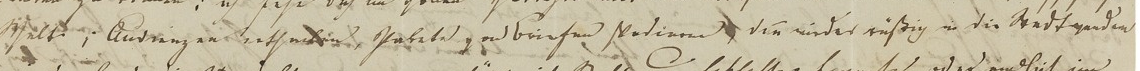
Welt; Audienzen ertheilen, Pakete von Briefen spediren, dann wieder rüstig in die Stadt wandern
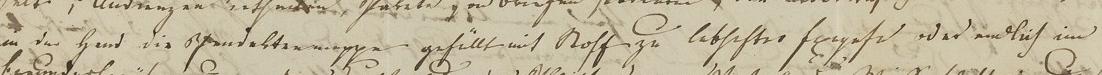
in der Hand die Pandektenmappe gefüllt mit Stoff zu lebhafter Exegese oder endlich im
